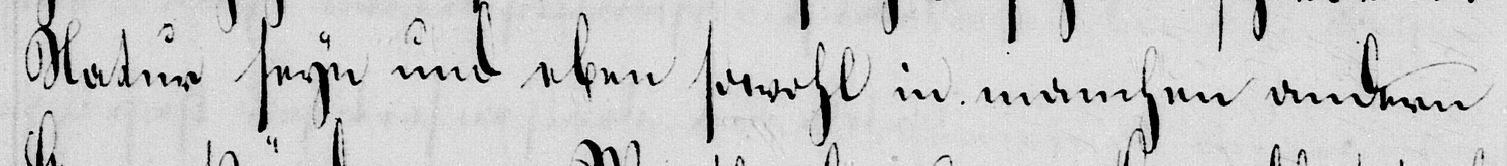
Natur seyn und eben sowohl in manchen andern
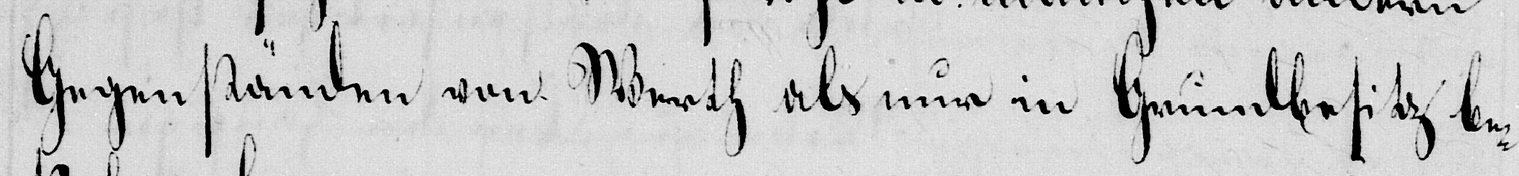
Gegenständen von Werth als nur in Grundbesitz be¬
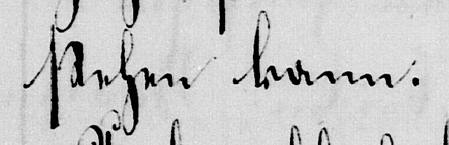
stehen kann.
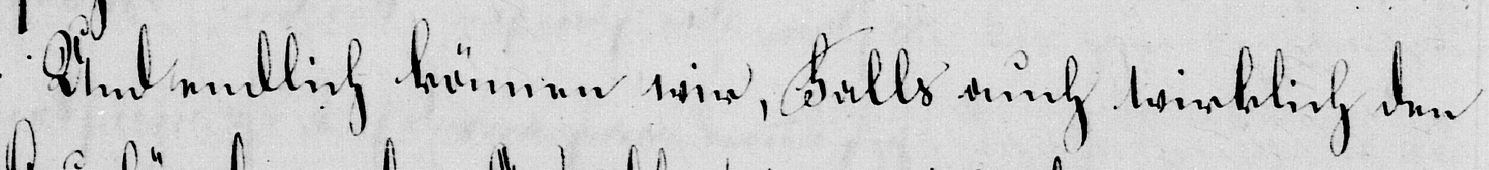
Und endlich können wir, Falls auch wirklich den
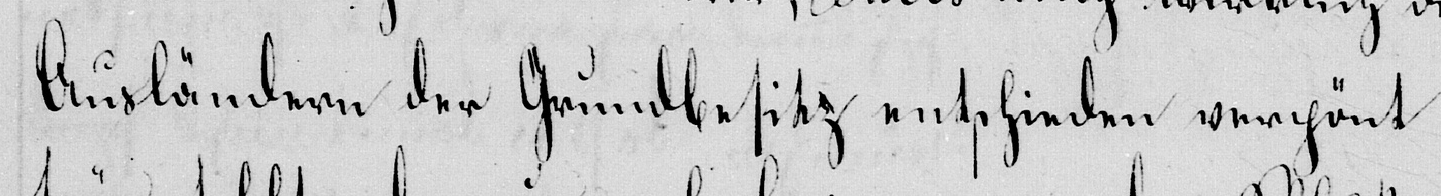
Ausländern der Grundbesitz entschieden verpönt
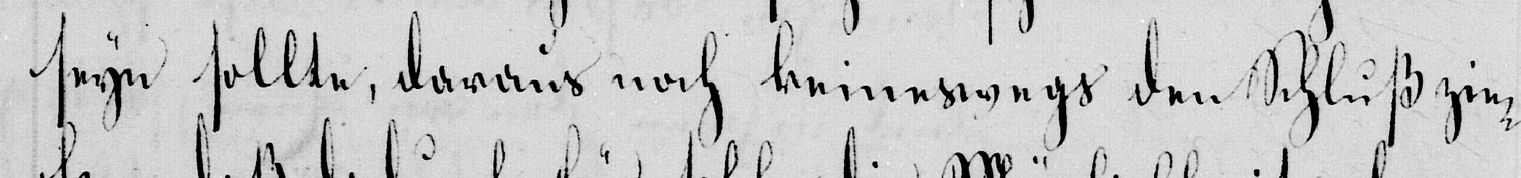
seyn sollte, daraus noch keineswegs den Schluß zie¬
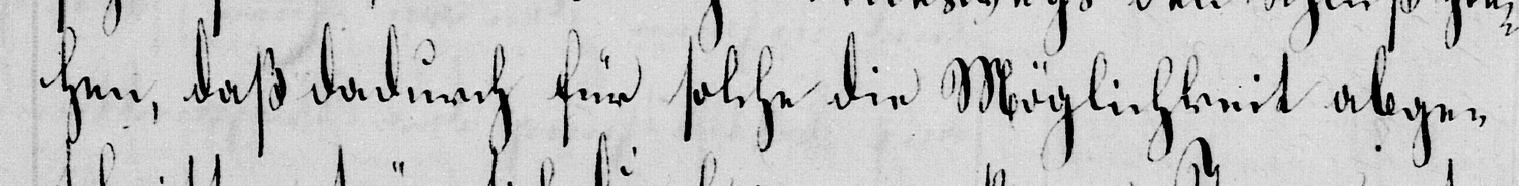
hen, daß dadurch für solche die Möglichkeit abge¬
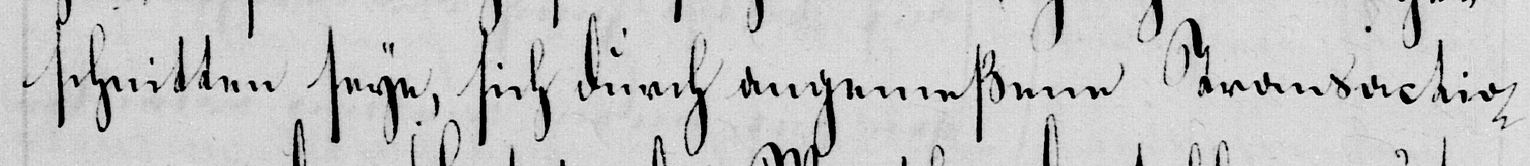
schnitten seye, sich durch angemeßene Transactio¬
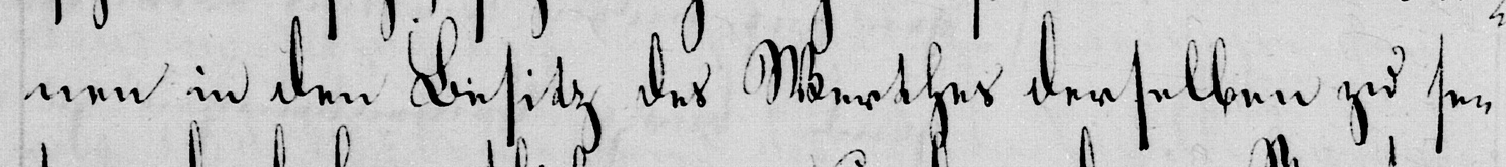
nen in den Besitz des Werthes derselben zu se¬
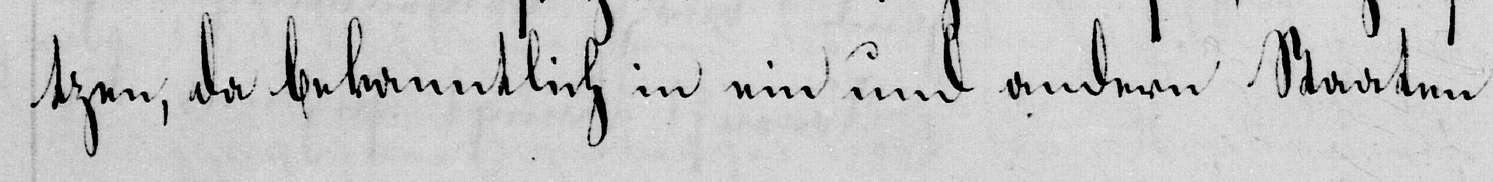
tzen, da bekanntlich in ein und andern Staaten
